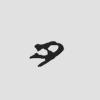胃
